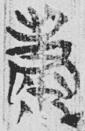康
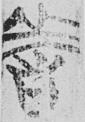善
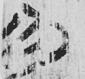勿
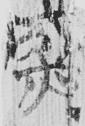○（滅）
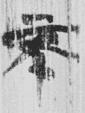不
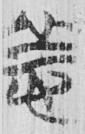恙（祥）
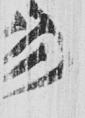勿
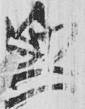爲
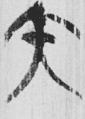内（入）
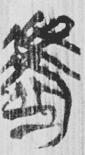虛
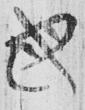母
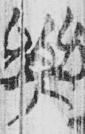樂
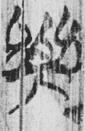樂
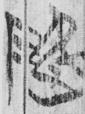○（登）
